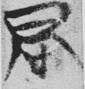君
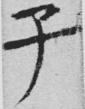子
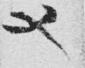又（有）
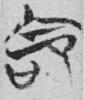命
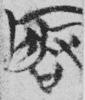啓
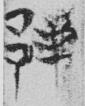邦
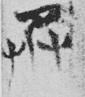丞（承）
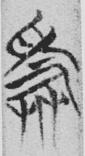{爪家}（家）
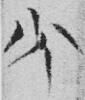人小
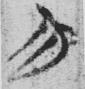勿
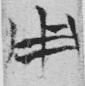用
